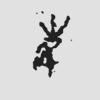徴
